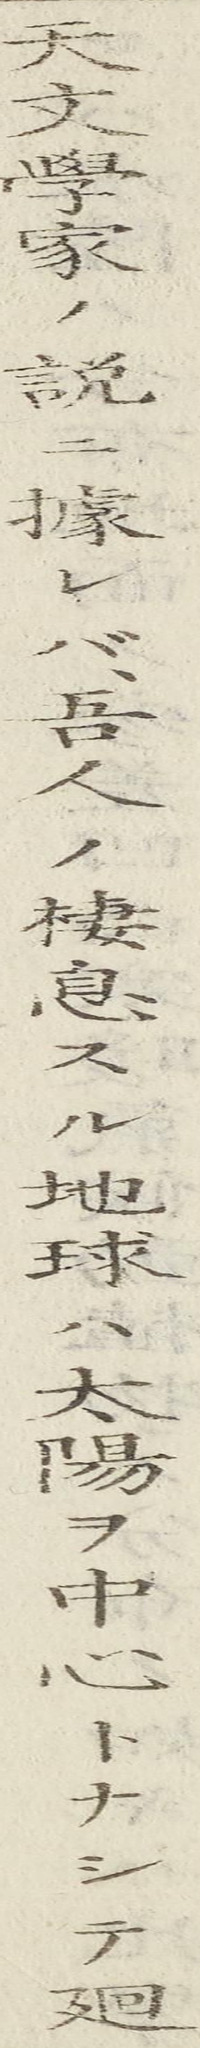天文学家ノ説ニ拠レバ、吾人ノ棲息スル地球ハ太陽ヲ中心トナシテ廻
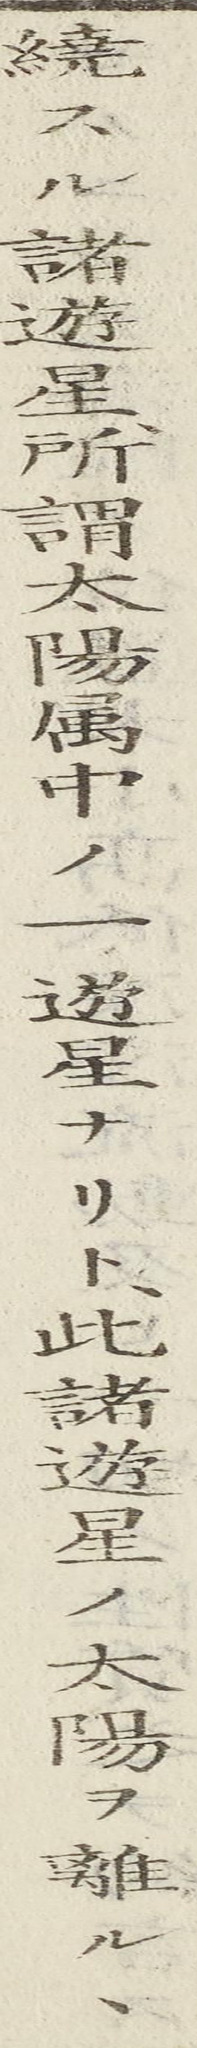繞スル諸遊星、所謂太陽属中ノ一遊星ナリト、此諸遊星ノ太陽ヲ離ルヽ
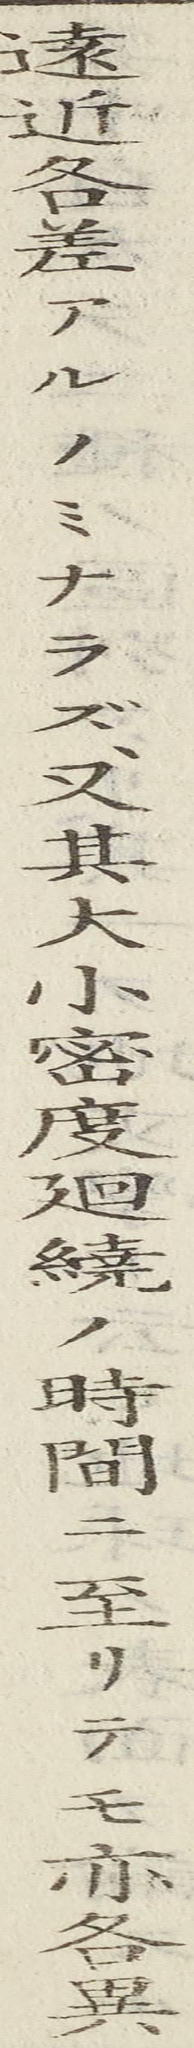遠近各差アルノミナラズ、又其大小密度廻繞ノ時間ニ至リテモ亦各異
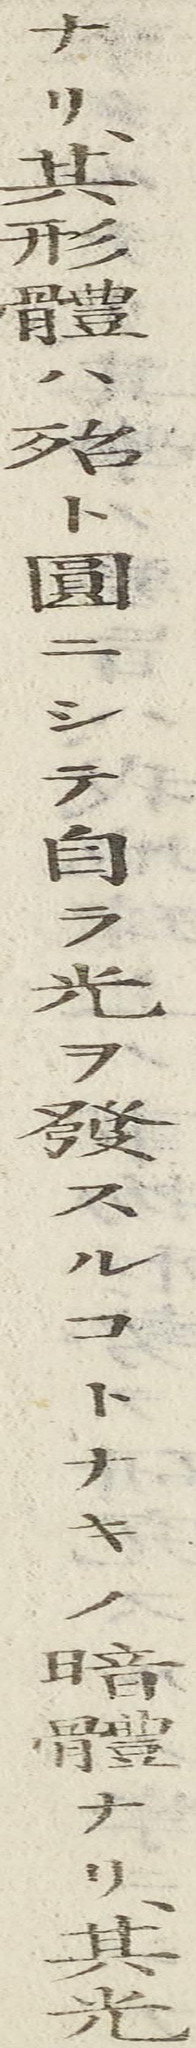ナリ、其形体ハ殆ト円ニシテ自ラ光ヲ発スルコトナキノ暗体ナリ、其光
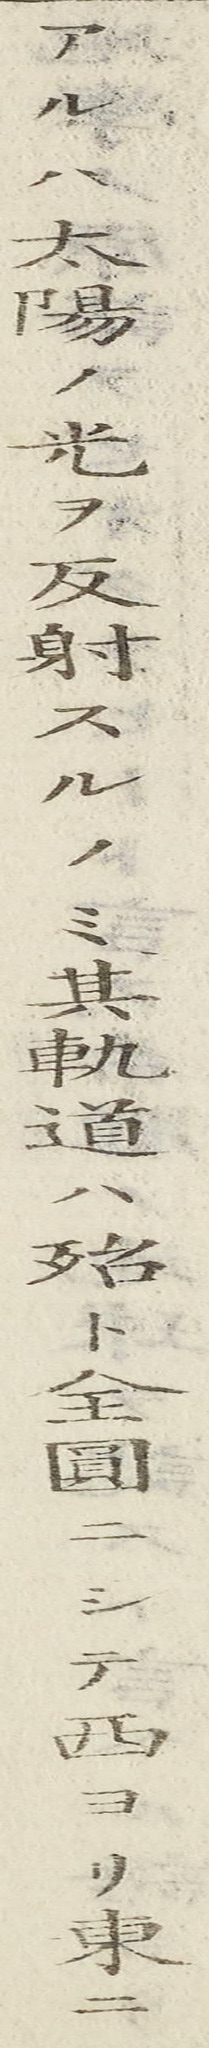アルハ太陽ノ光ヲ反射スルノミ、其軌道ハ殆ト全円ニシテ西ヨリ東ニ
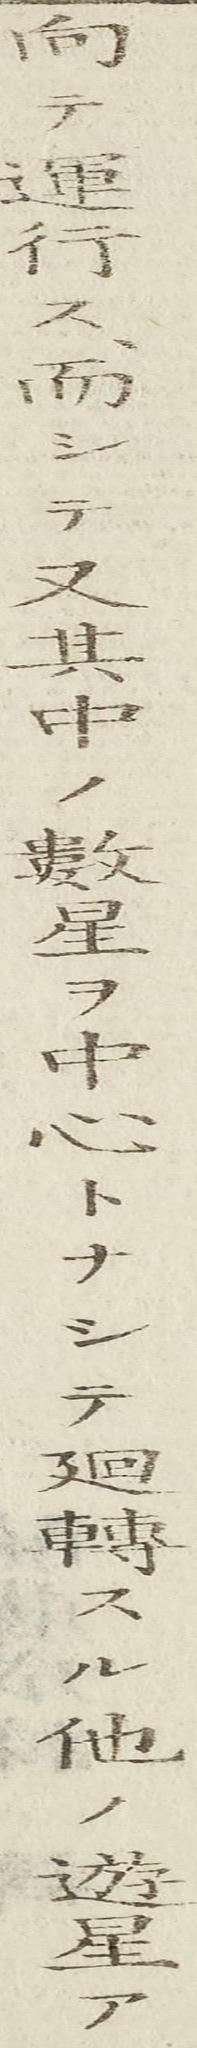向テ運行ス、而シテ又其中ノ数星ヲ中心トナシテ廻転スル他ノ遊星ア
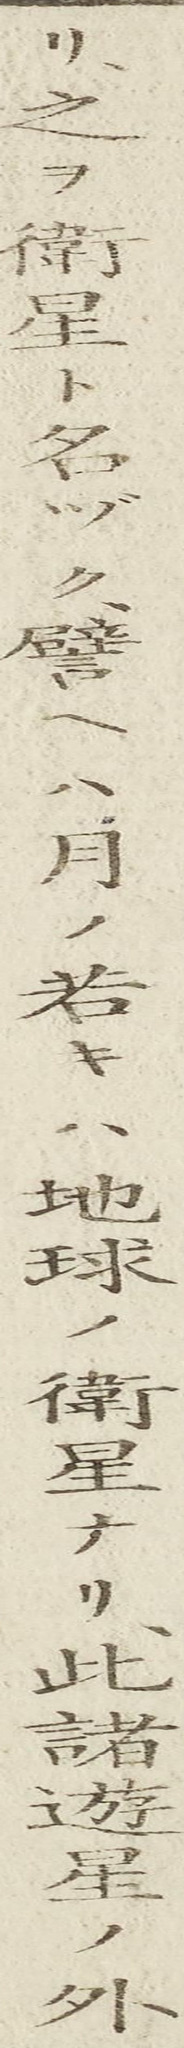リ、之ヲ衛星ト名ヅク、譬ヘハ月ノ若キハ地球ノ衛星ナリ、此諸遊星ノ外
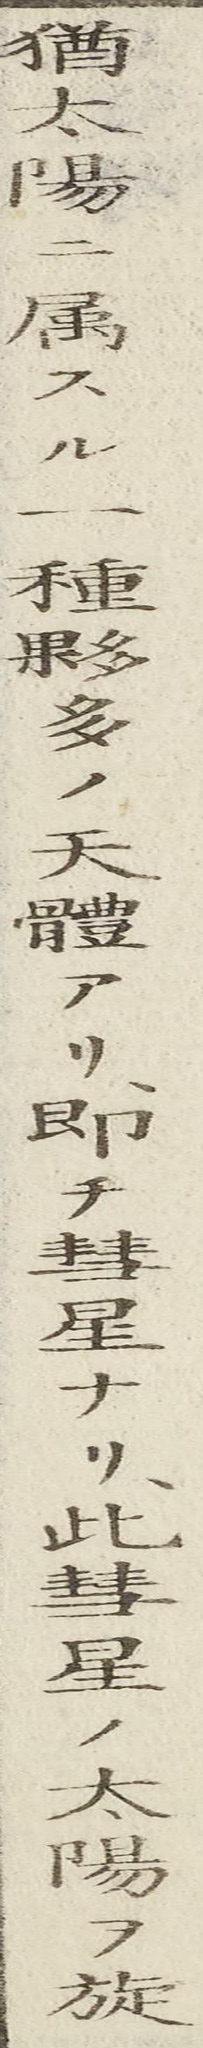猶太陽ニ属スル一種夥多ノ天体アリ、即チ彗星ナリ、此彗星ノ太陽ヲ旋
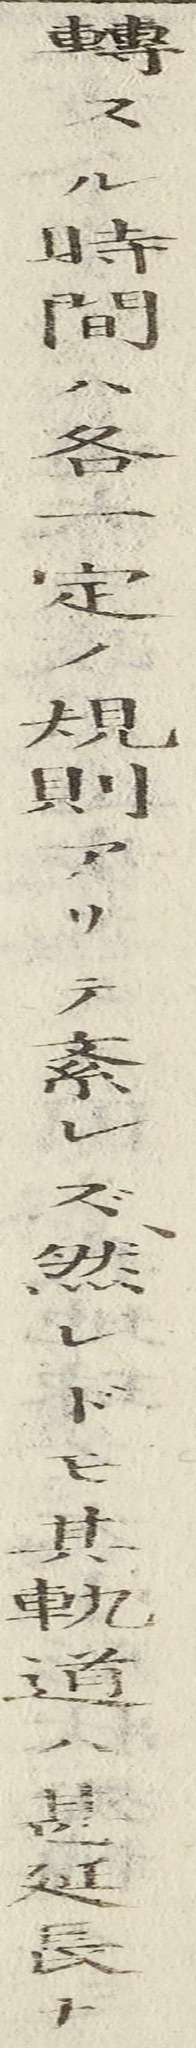転スル時間ハ各一定ノ規則アリテ紊レズ、然レドモ其軌道ハ甚延長ナ
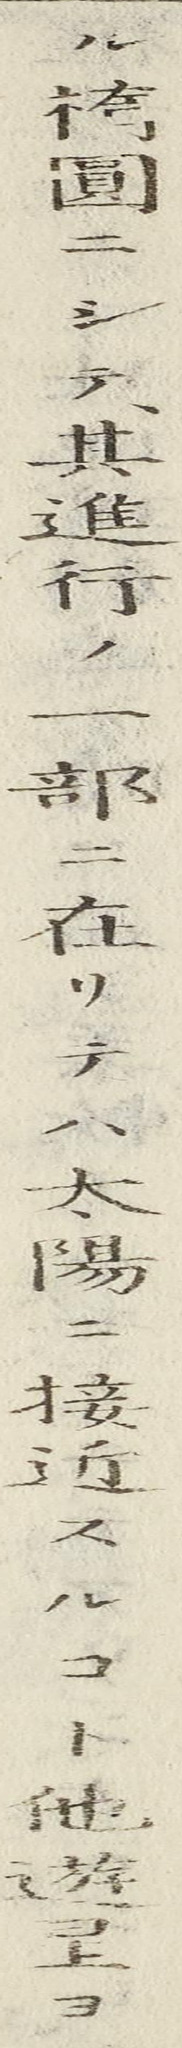ル楕円ニシテ、其進行ノ一部ニ在リテハ太陽ニ接近スルコト他遊星ヨ
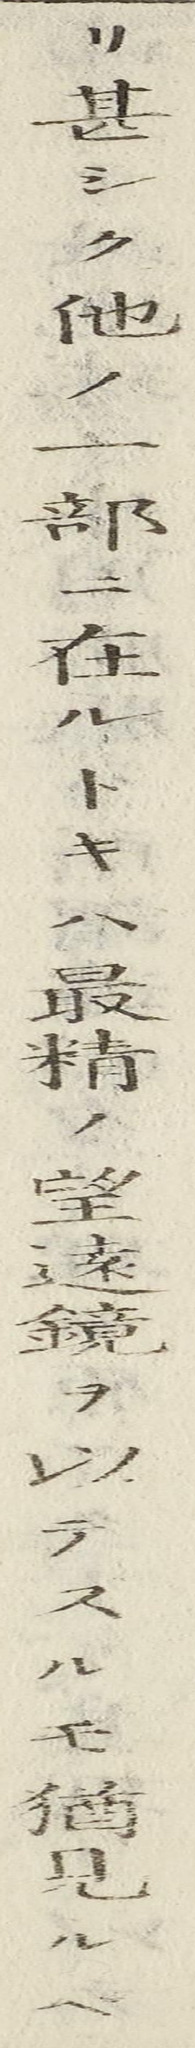リ甚シク他ノ一部ニ在ルトキハ最精ノ望遠鏡ヲ以テスルモ猶見ルベ
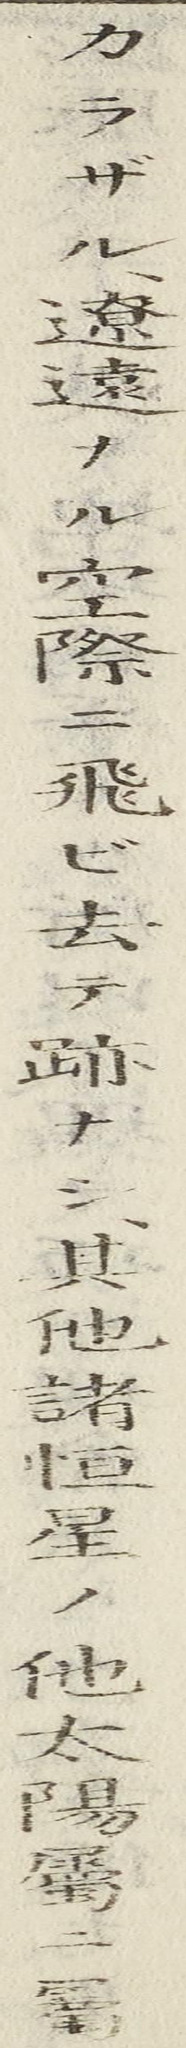カラザル、遼遠ナル空際ニ飛ビ去テ跡ナシ、其他諸恒星ノ他太陽属ニ属
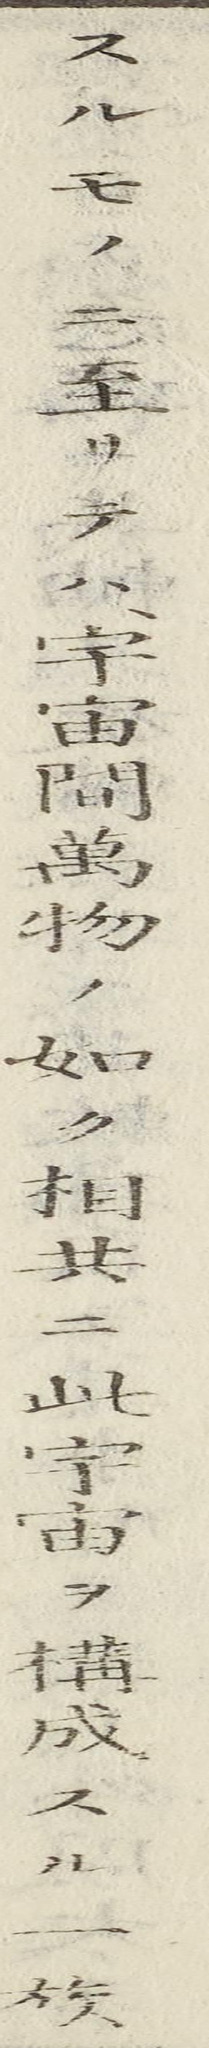スルモノニ至リテハ、宇宙間万物ノ如ク相共ニ此宇宙ヲ構成スル一族
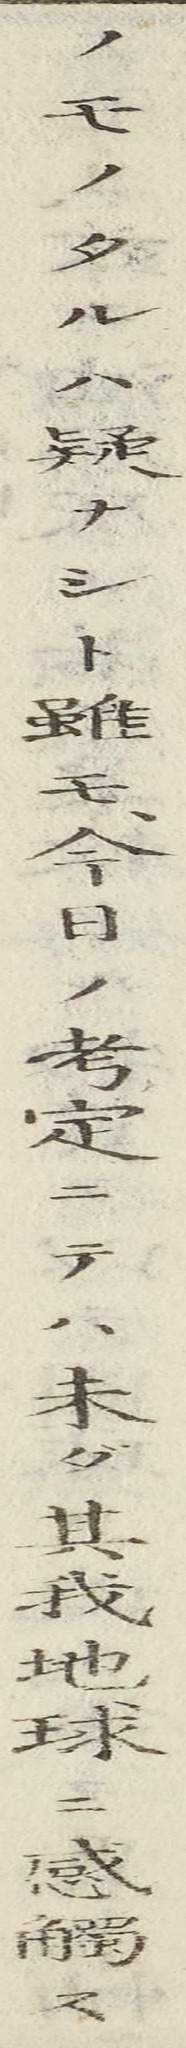ノモノタルハ疑ナシト雖モ、今日ノ考定ニテハ未ダ其我地球ニ感触ス
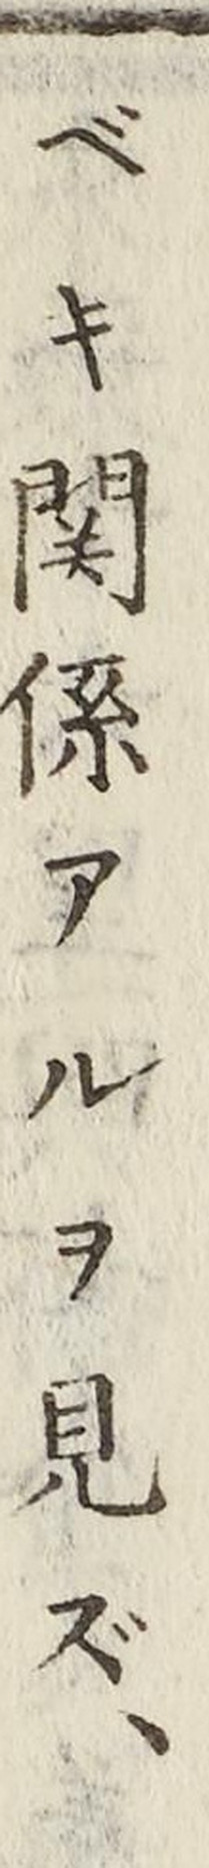ベキ関係アルヲ見ズ、
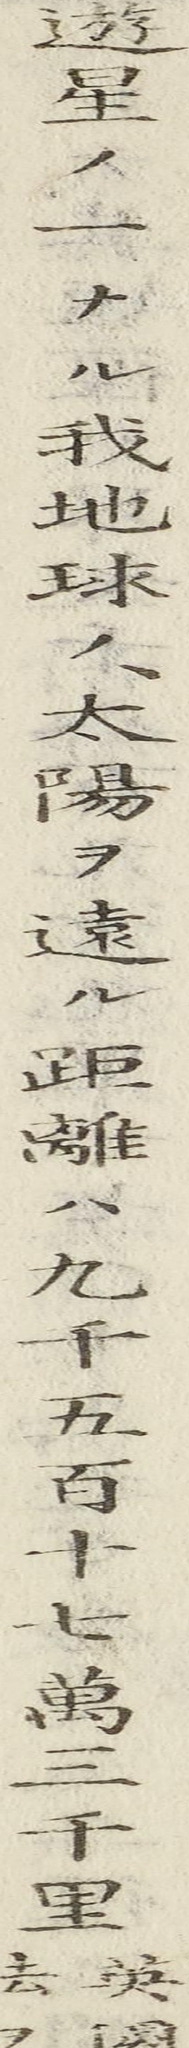遊星ノ一ナル我地球ノ、太陽ヲ遠ル距離ハ九千五百十七万三千里英国法ヲ
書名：百科全書　地文學　全
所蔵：東京大学地震研究所図書室 Earthquake Research Institute Library, The University of Tokyo, JAPAN
